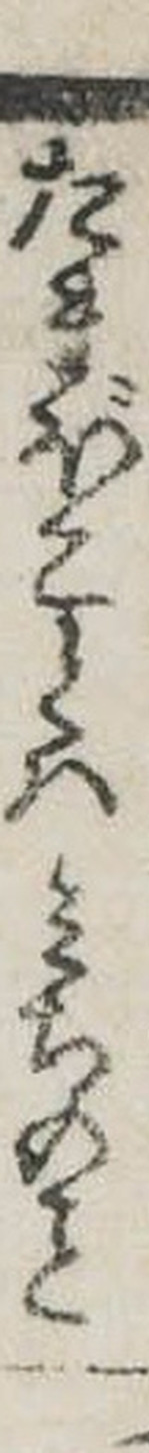たまぼことはみちのこと
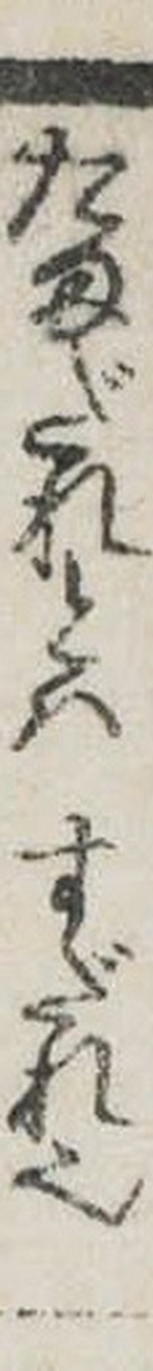たまだれとはすだれ也
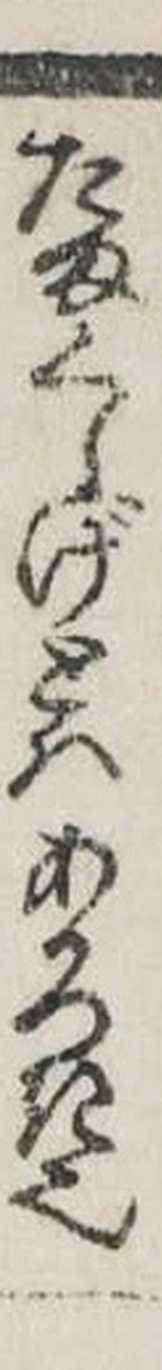たまくしげとはあかつき也
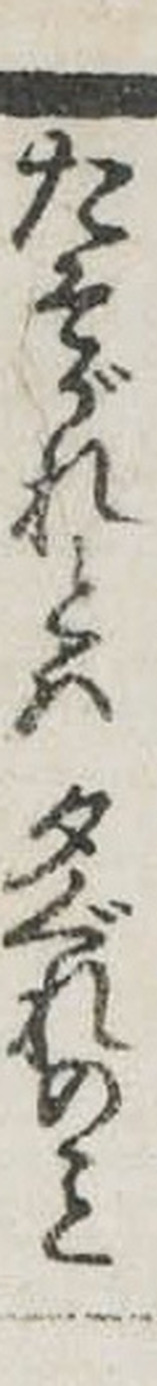たそがれとは夕ぐれのこと
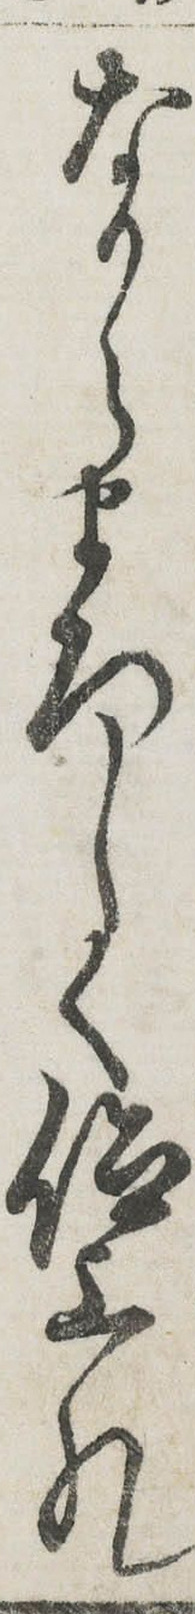なからよろしく仰上られ
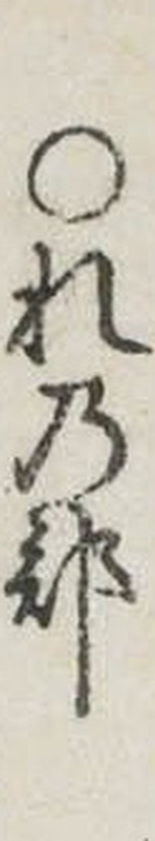○れの部
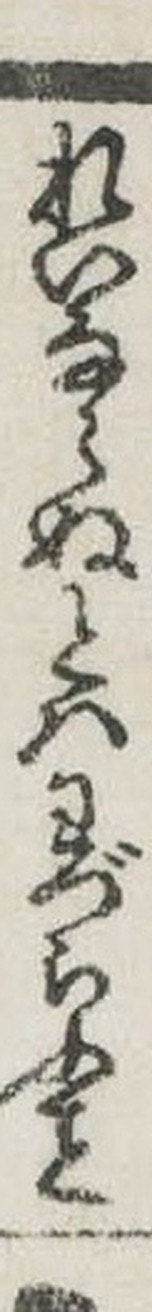れいならぬとはわづらふこと
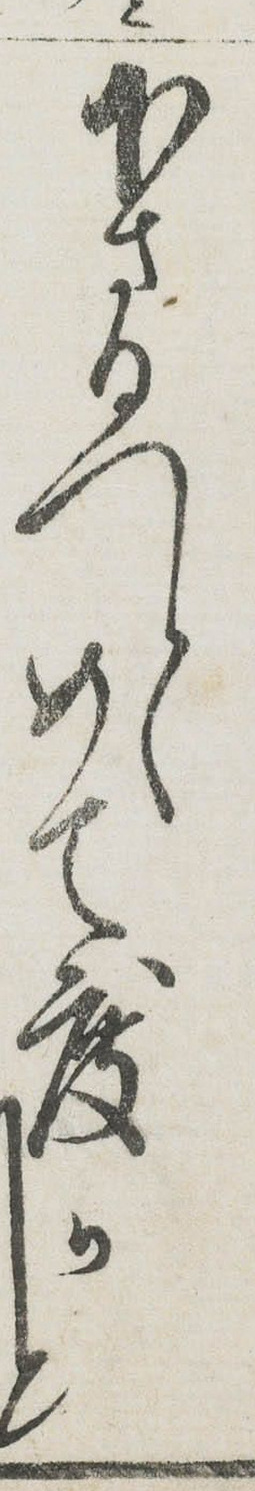下さるへく候めて度かしく
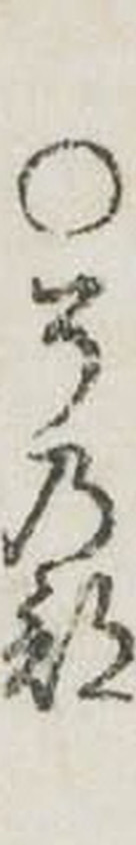○その部
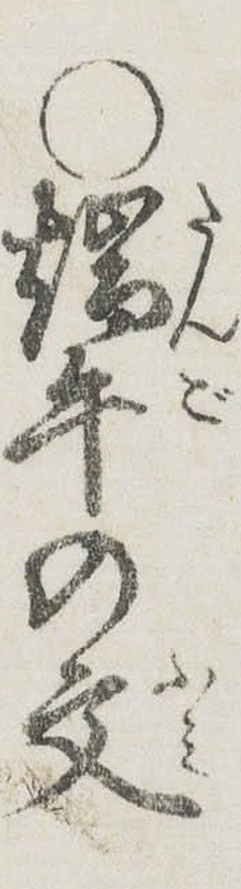○端午の文
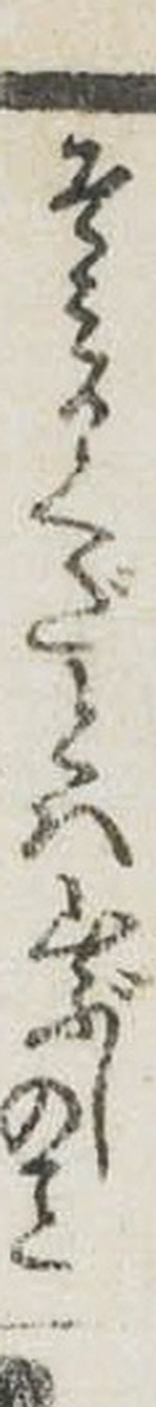そみかくだとは山ぶしのこと
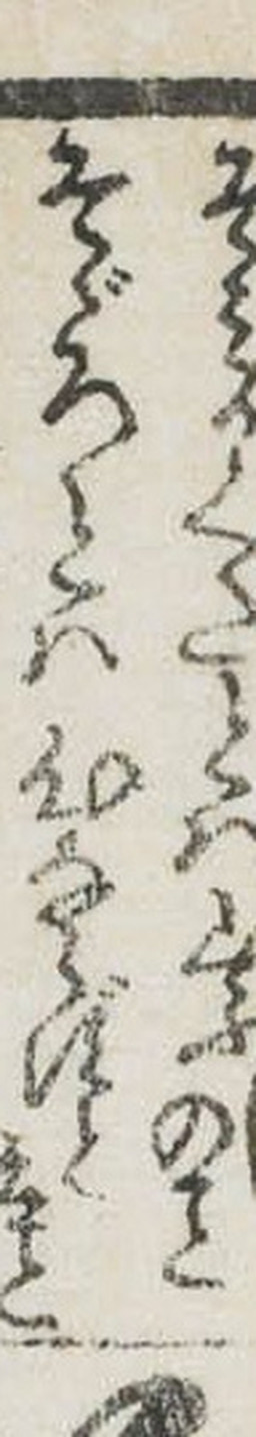そゞろとは心ならずと云こと
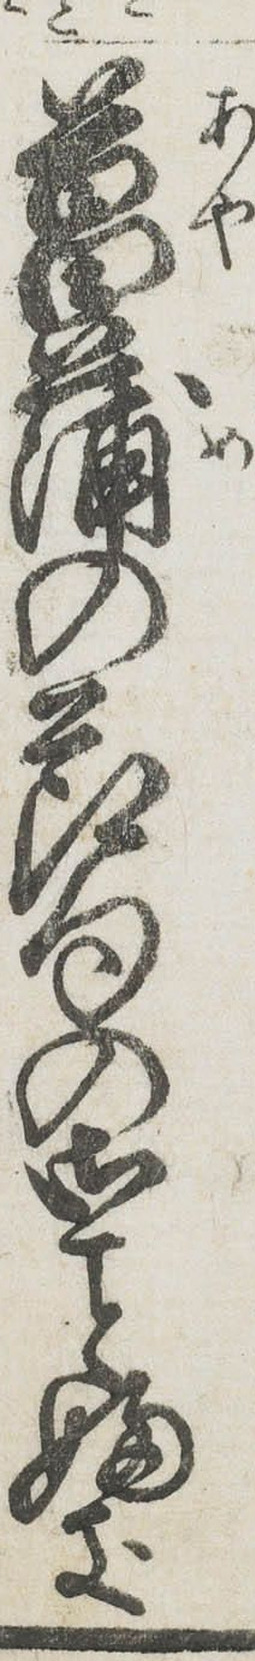菖蒲の節句の御ことふき
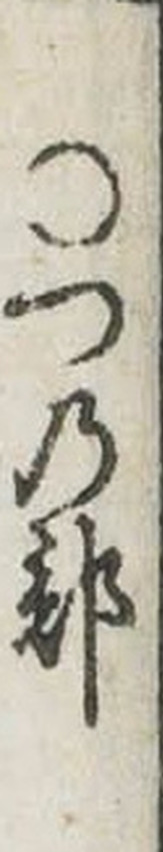○つの部
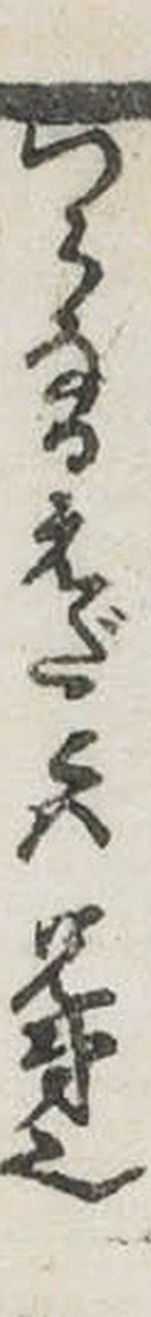つらなるえだとは兄弟也
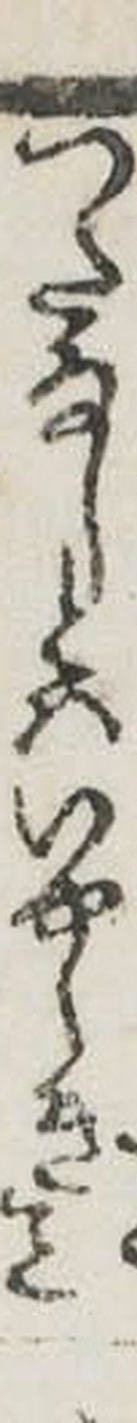つたなしとはいやしきこと
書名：頭書萬用婦人手紙之文言
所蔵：東京学芸大学教育コンテンツアーカイブ
